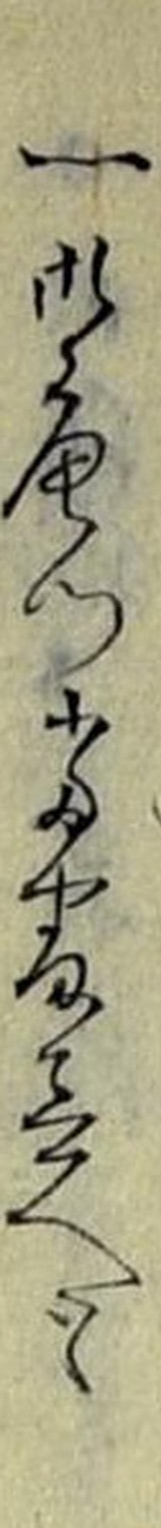一御唐門当番壱人ツヽ
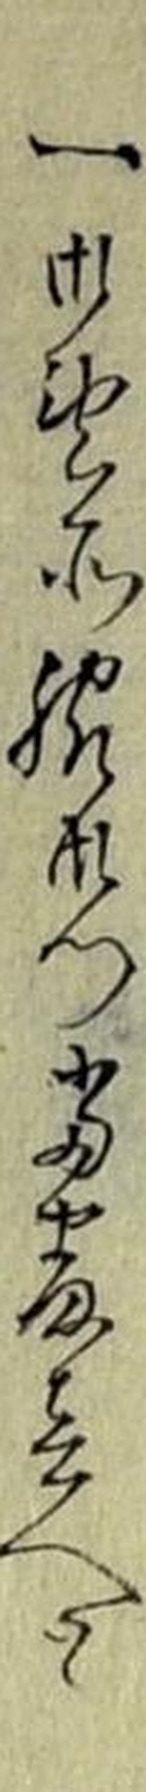一御台所脇御門当番壱人ツヽ
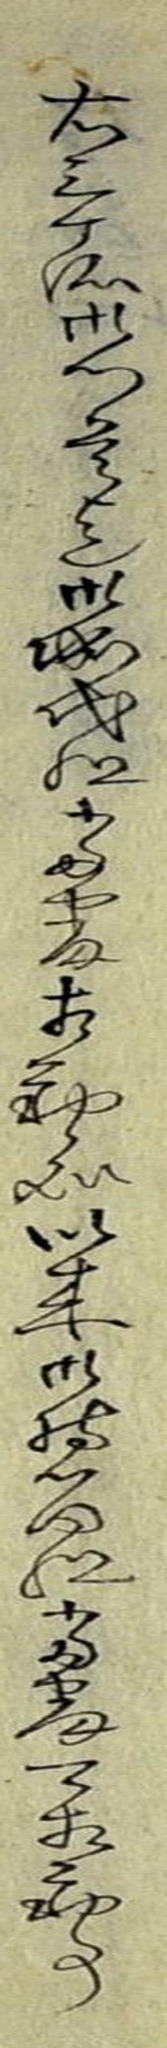右三ケ所御門是迄御城代組当番相勤候処以来御持筒組当番可相勤事
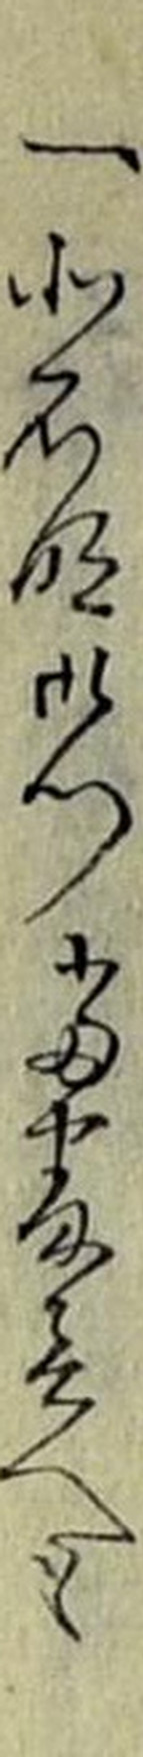一北不明御門当番壱人ツヽ
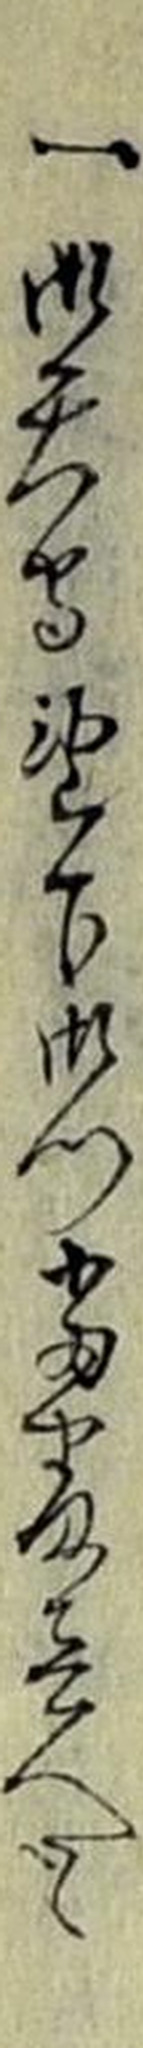一御天守台下御門当番壱人ツヽ
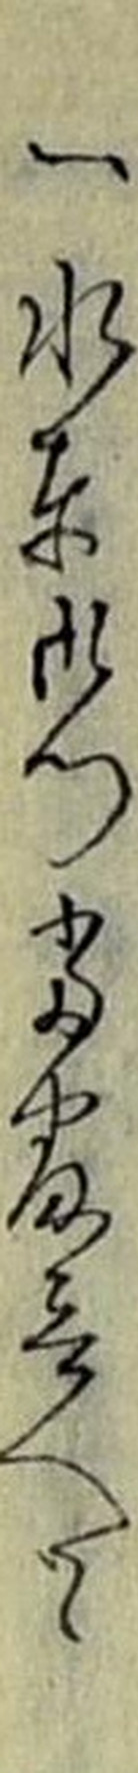一水車御門当番壱人ツヽ
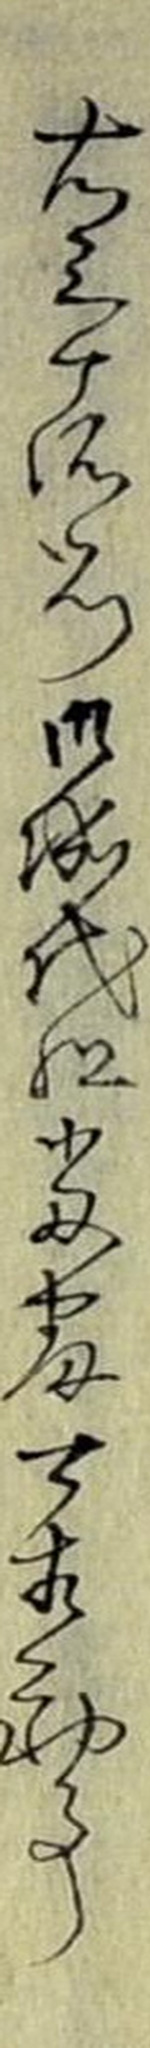右三ケ所御門御城代組当番可相勤事
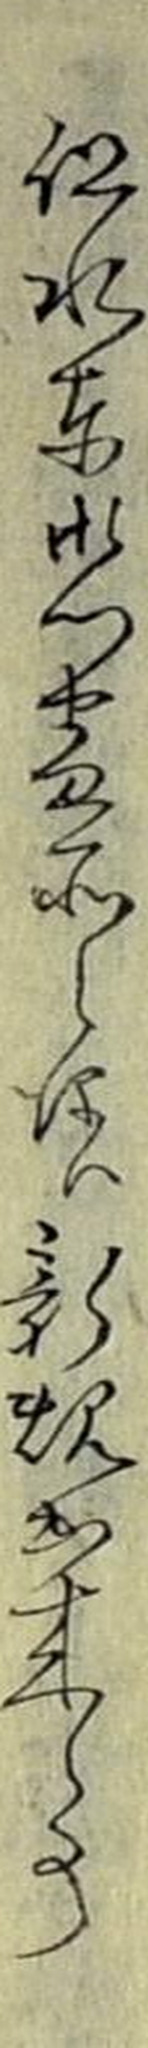但水車御門番所之儀ハ新規出来事
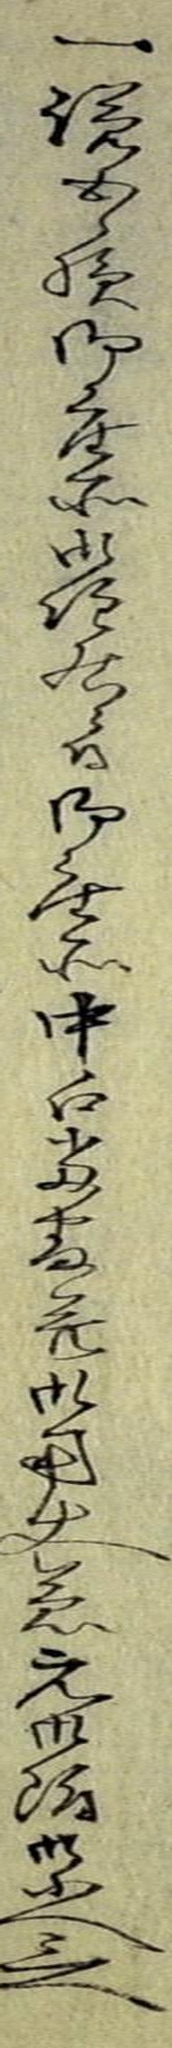一謙五郎様御座所御住居ニ付御座所中ノ口当番并御用使兼元御附御小人三人
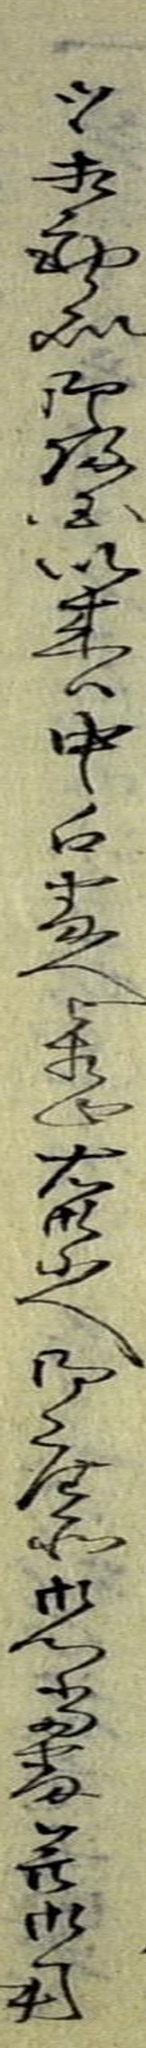ツヽ相勤候処御帰国以来ハ中ノ口番人被相止右御小人御座所御門当番并御用
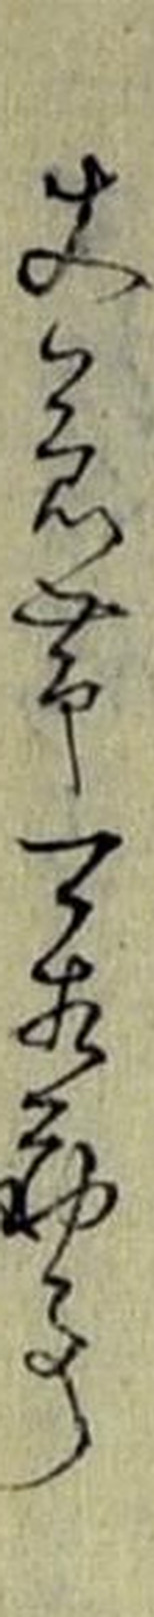使兼帯可相勤事
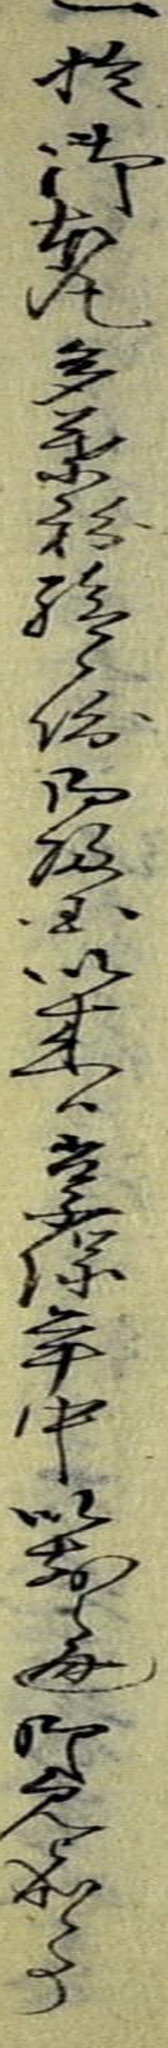一於御本丸多葉粉験候儀御帰国以来ハ享保年中以前之通御免被成候事
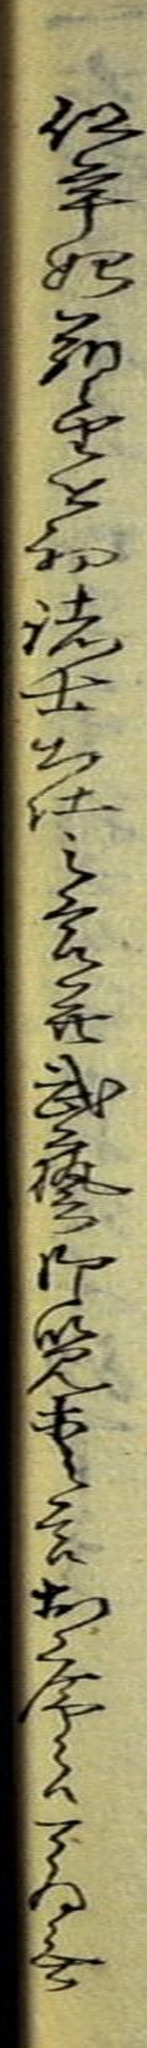但年始朔之坐を初諸士出仕之節并武芸御覧等之節於席々ハ可為無
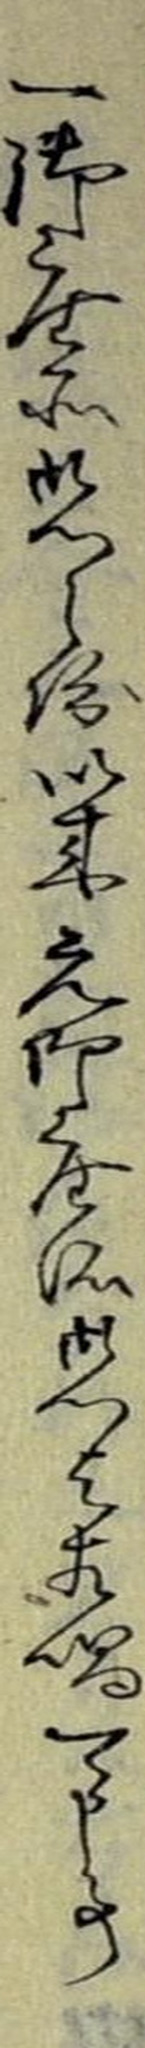一御座所御門之儀以来元御座所御門与相唱可申事
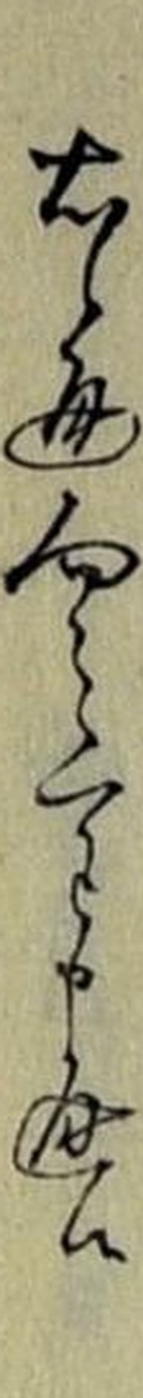右之通面々へ可被申通候
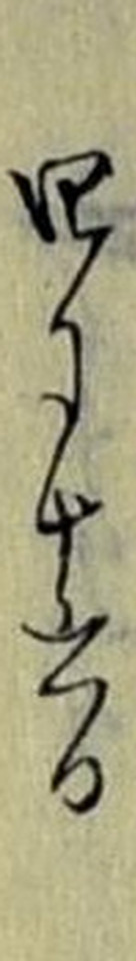四月十一日
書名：命令之部 五
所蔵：福井県文書館 Fukui Prefectural Archives
